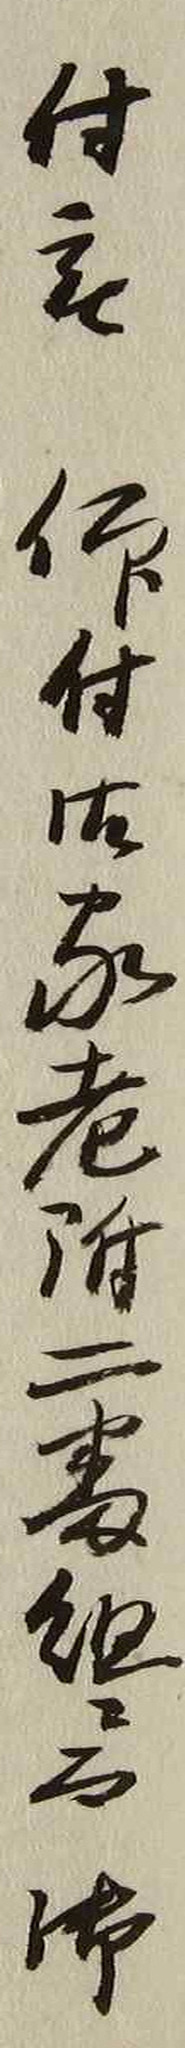付被仰付御家老附二番組ニ而御
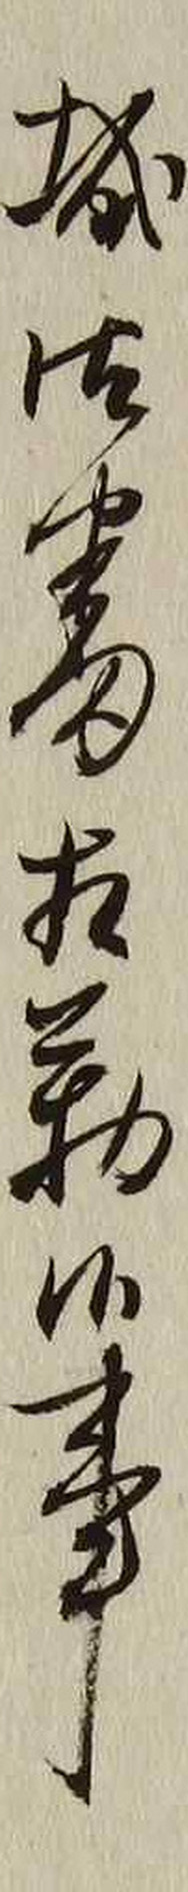城御番相勤候事
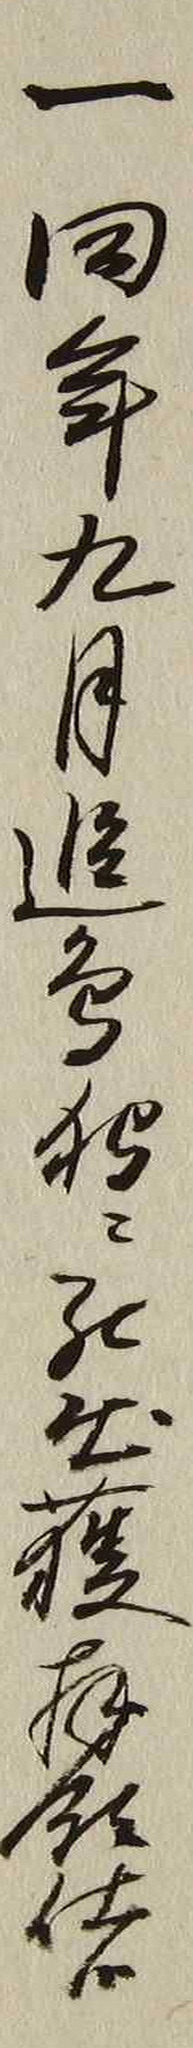一同年九月追鳥狩ニ罷出獲拝領仕候
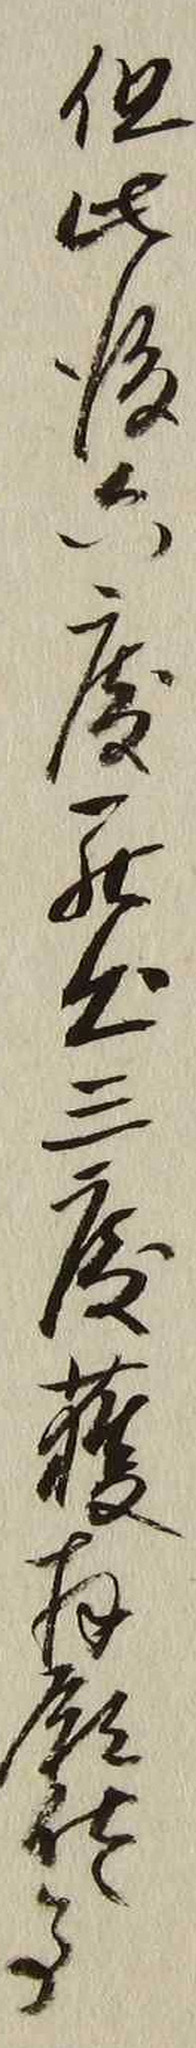但此後六度罷出三度獲拝領仕候事
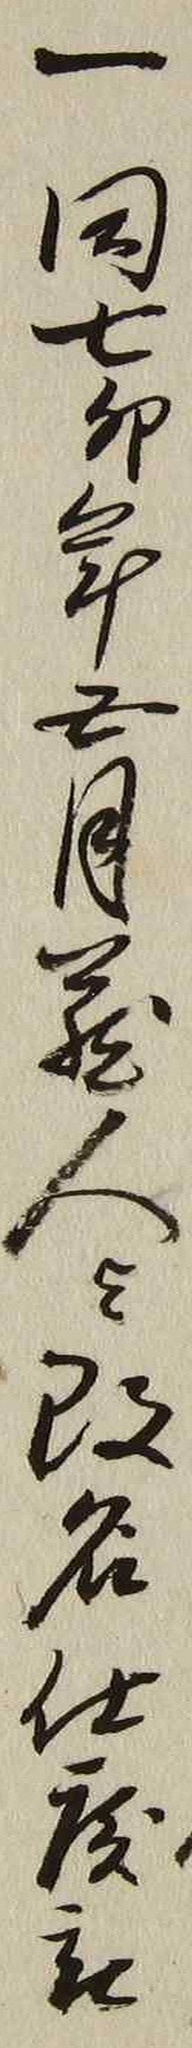一同七卯年五月蔵人与改名仕度被
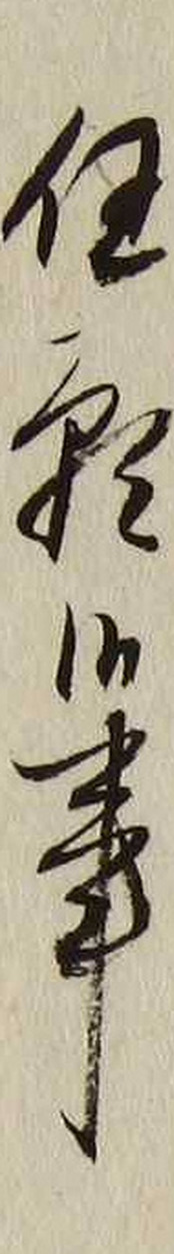任願候事
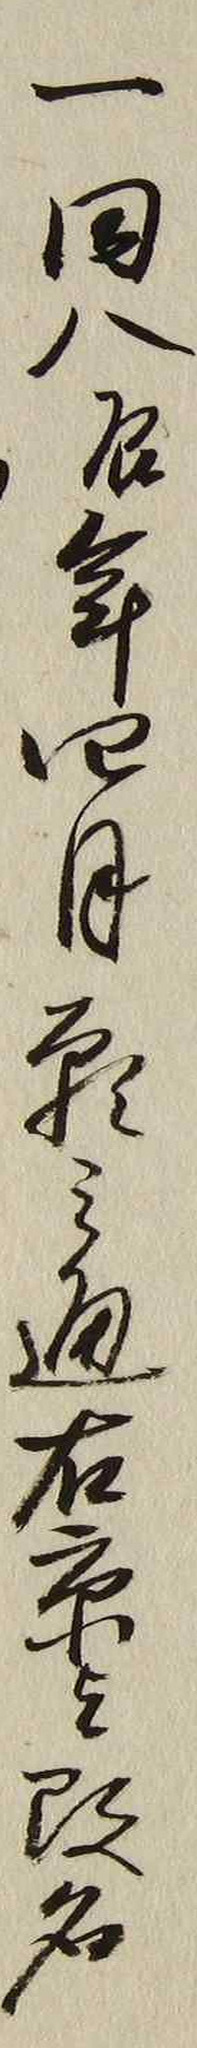一同八辰年四月願之通右京与改名
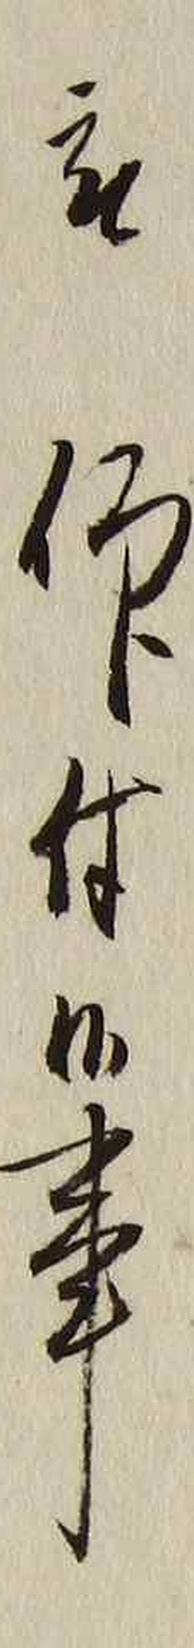被仰付候事
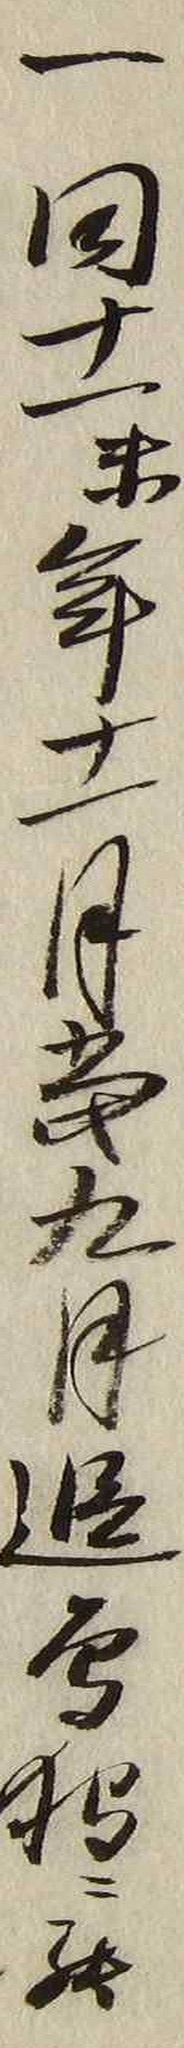一同十一未年十一月当九月追烏狩ニ罷
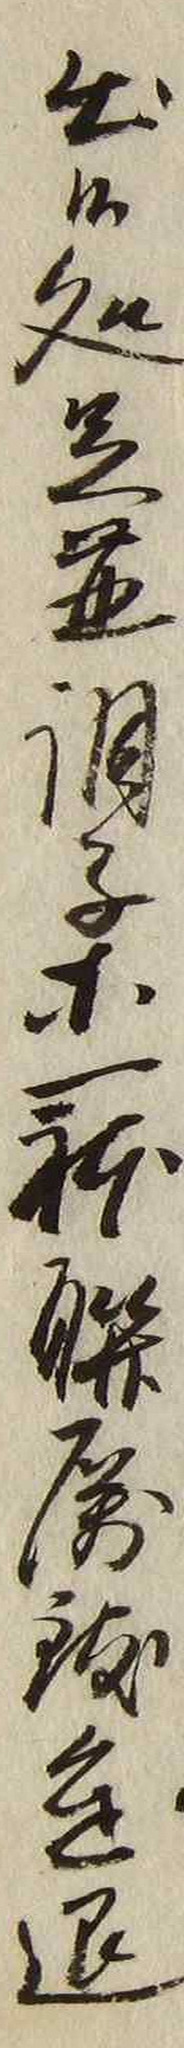出候処足並調子等一体聯属致進退

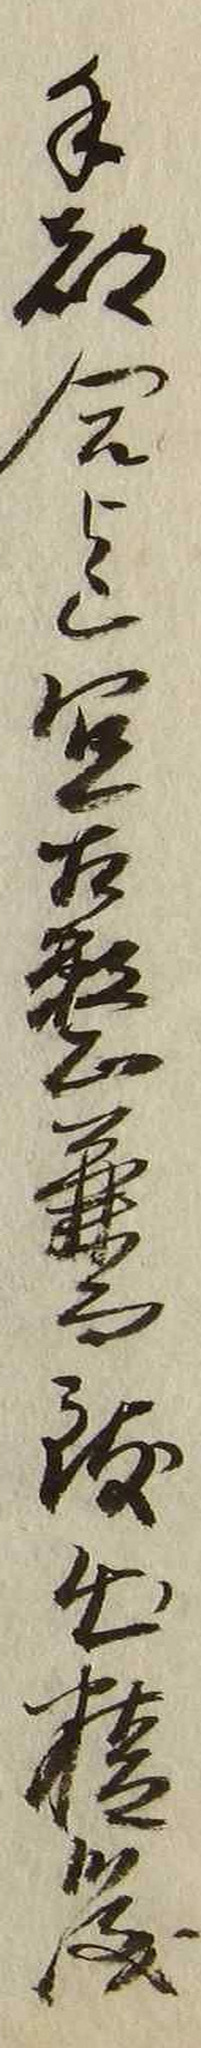手都合迄宜相整兼而致出精候儀
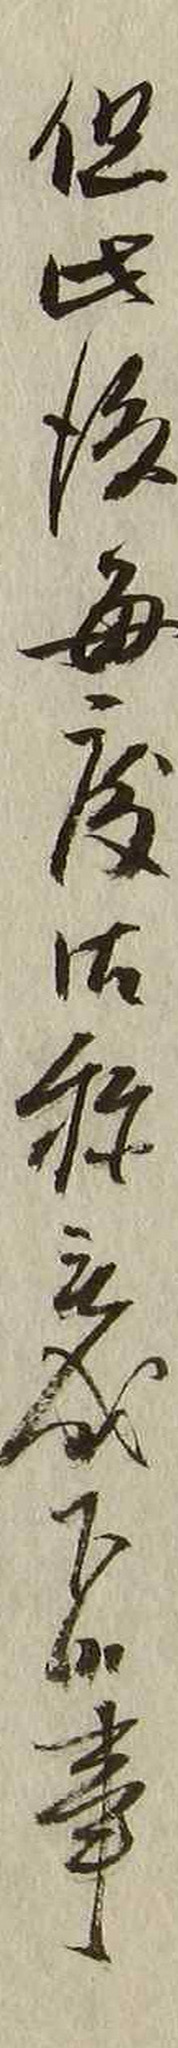但此後毎度御称被成下候事
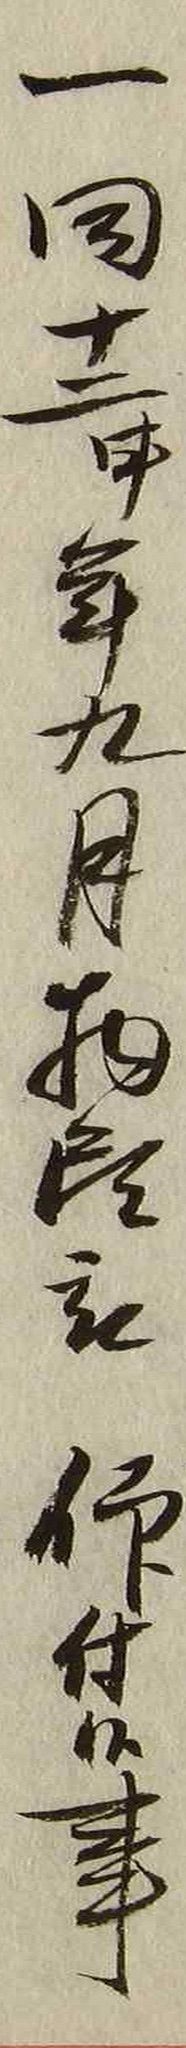一同十二申年九月物頭被仰付候事
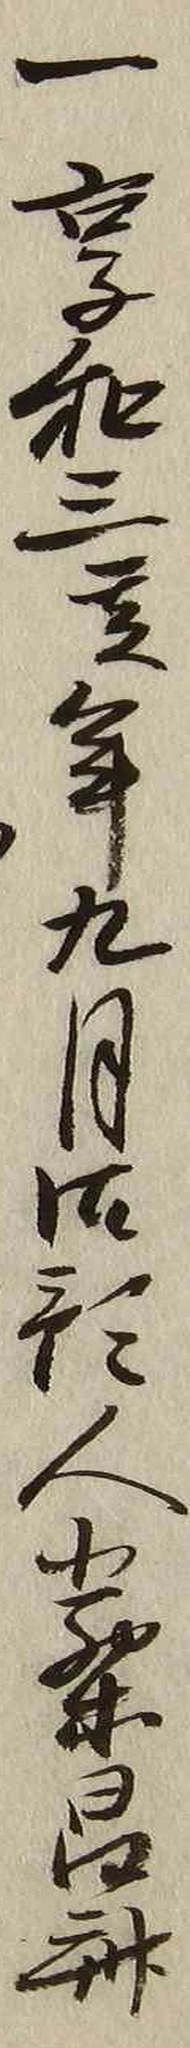一享和三亥年九月御預人小栗昌斉
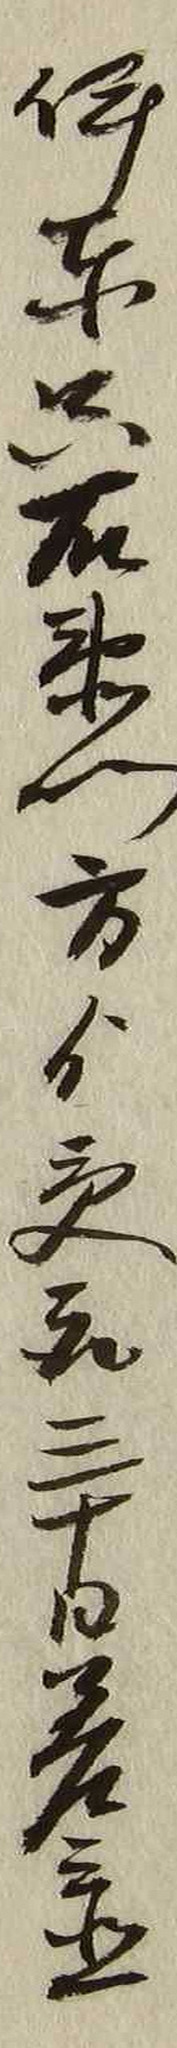伊東只右衛門方ゟ受取三十日差置
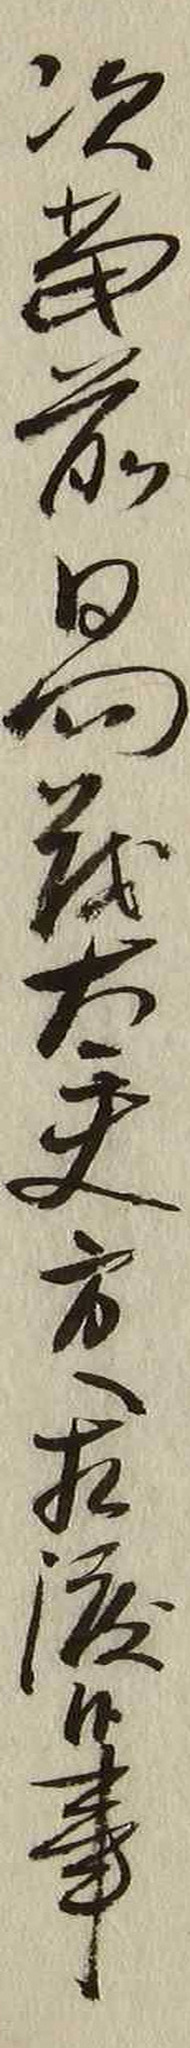次当前日向茂太夫方へ相渡候事
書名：諸士系譜　巻之356　す之部6
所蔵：会津若松市立会津図書館
